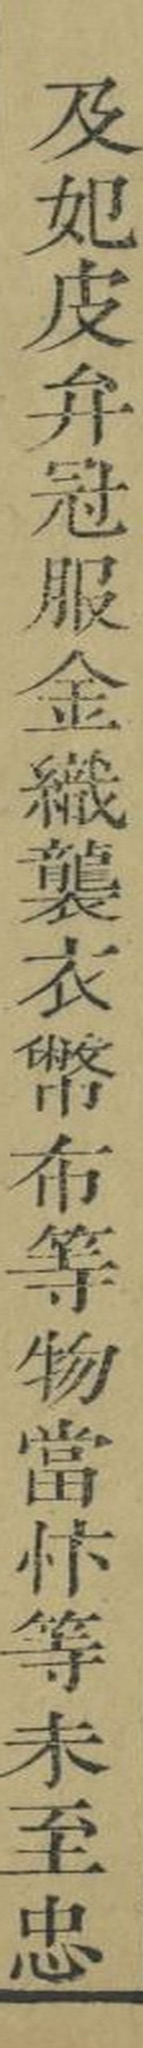及妃皮弁冠服金織襲衣幣布等物当忭等未至忠
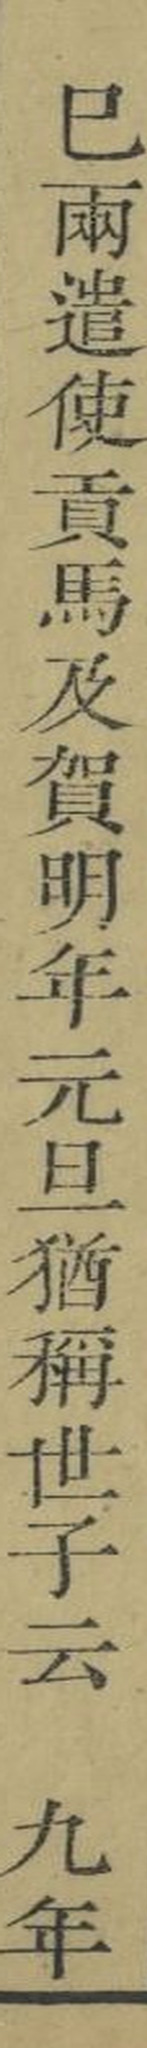巳両遣使貢馬及賀明年元旦猶称世子云九年
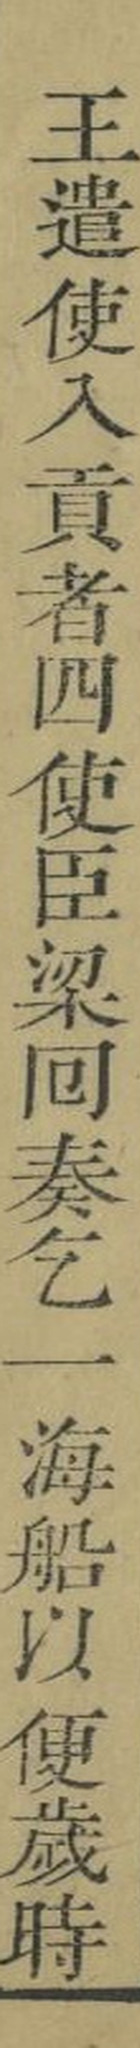王遣使入貢者四使臣梁回奏乞一海船以便歳時
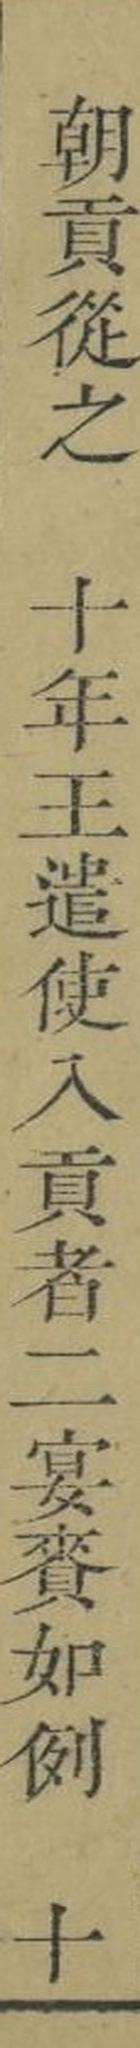朝貢従之十年王遣使入貢者二宴賚如例十
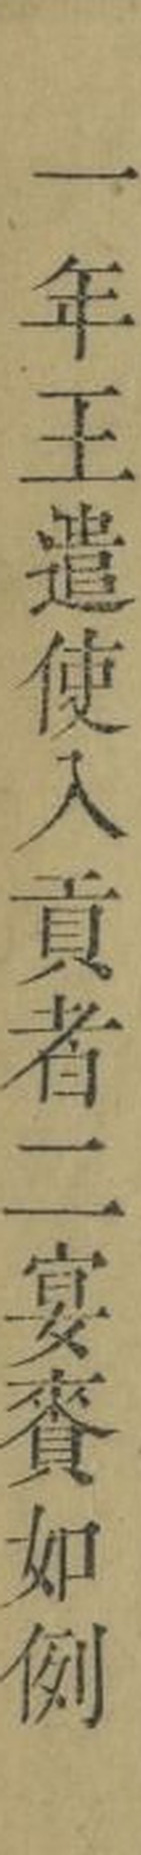一年王遣使入貢者二宴賚如例

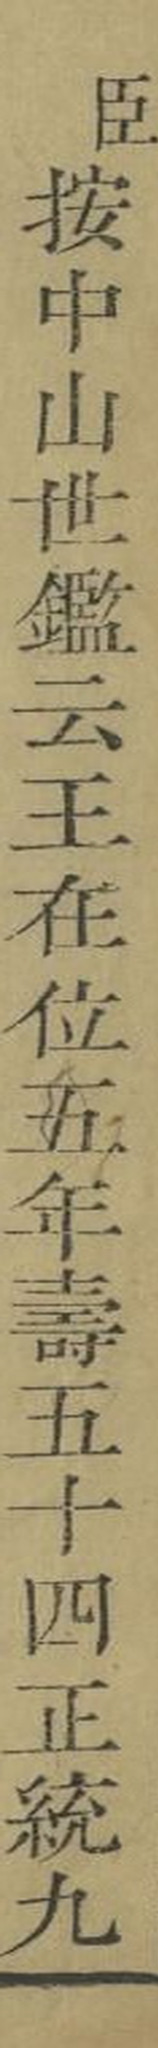臣按中山世鑑云王在位五年寿五十四正統九
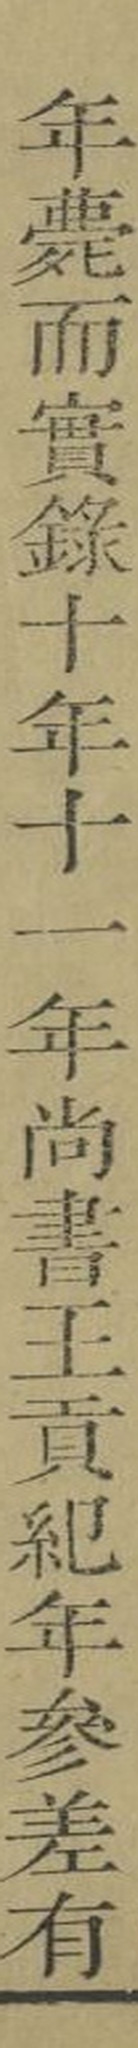年薨而実録十年十一年尚書王貢紀年参差有
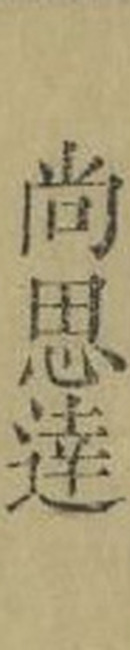尚思達
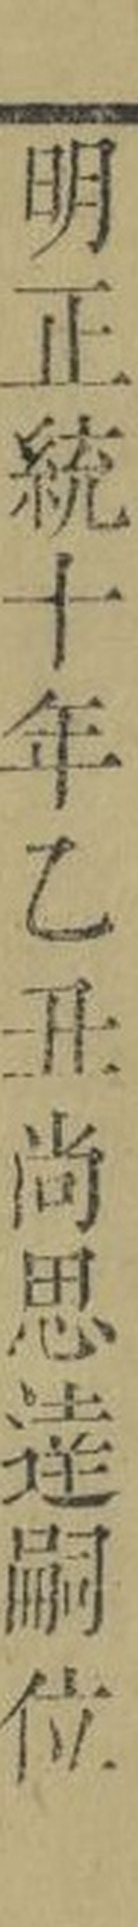明正統十年乙丑尚思達嗣位
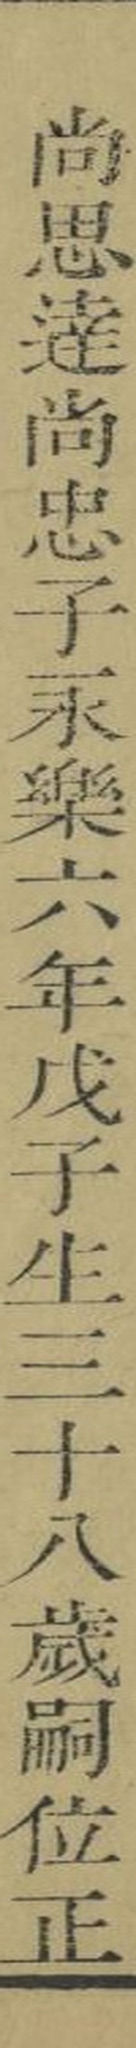尚思達尚忠子永楽六年戌子生三十八歳嗣位正
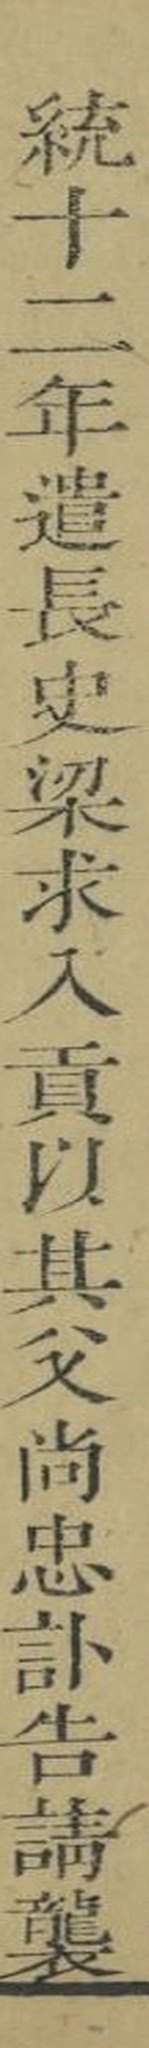統十二年遣長史梁求入貢以其父尚忠訃告請襲
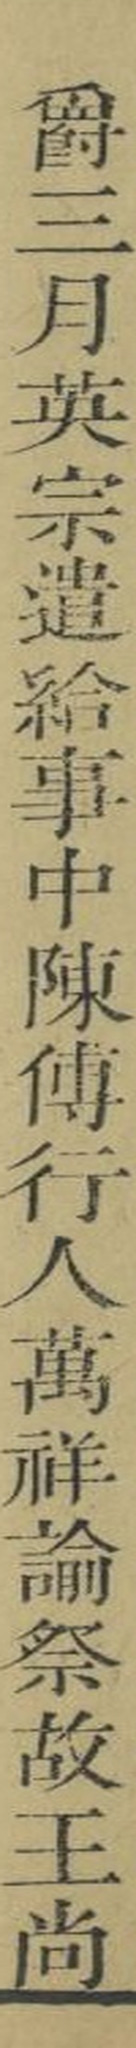爵三月英宗遣給事中陳傅行人万祥諭祭故王尚
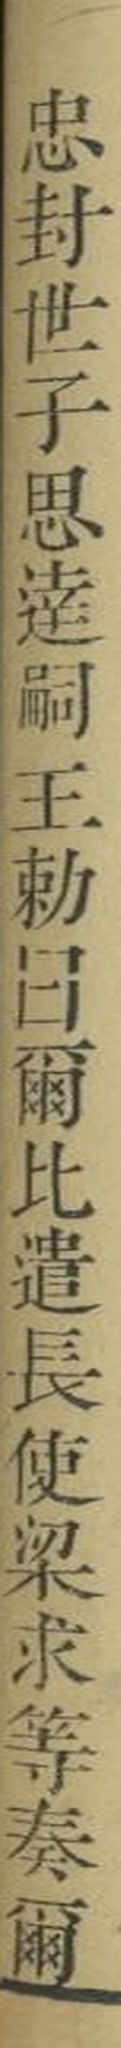忠封世子思達嗣王勅曰爾比遣長使梁求等奏爾
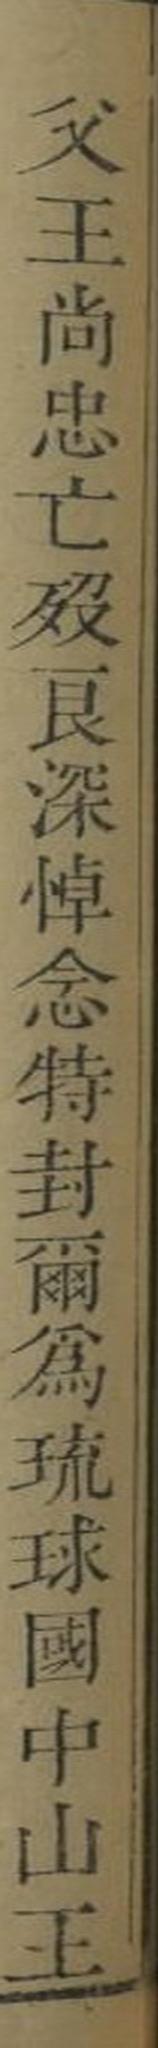父王尚忠亡歿良深悼念特封爾為琉球国中山王
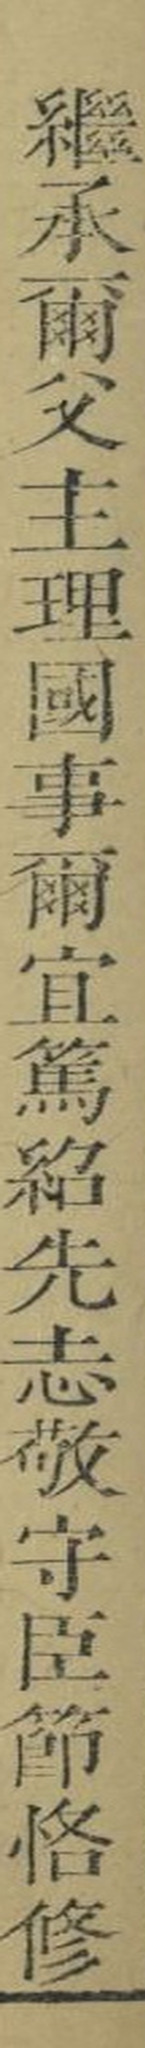継承爾父主理国事爾宜篤紹先志敬守臣節恪修
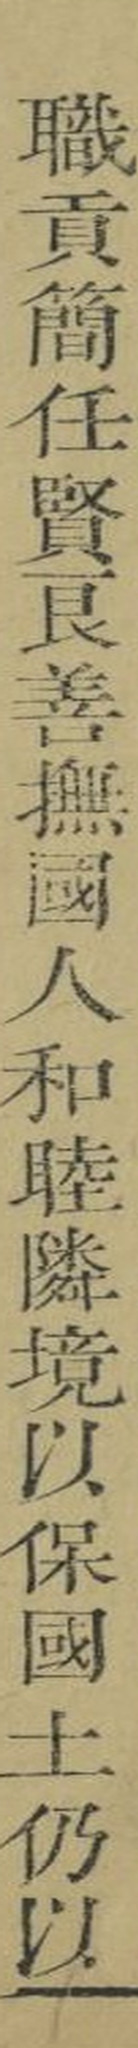職貢簡任賢良善撫国人和睦隣境以保国土仍以
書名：中山伝信録 巻三
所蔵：University of the Ryukyus Library
